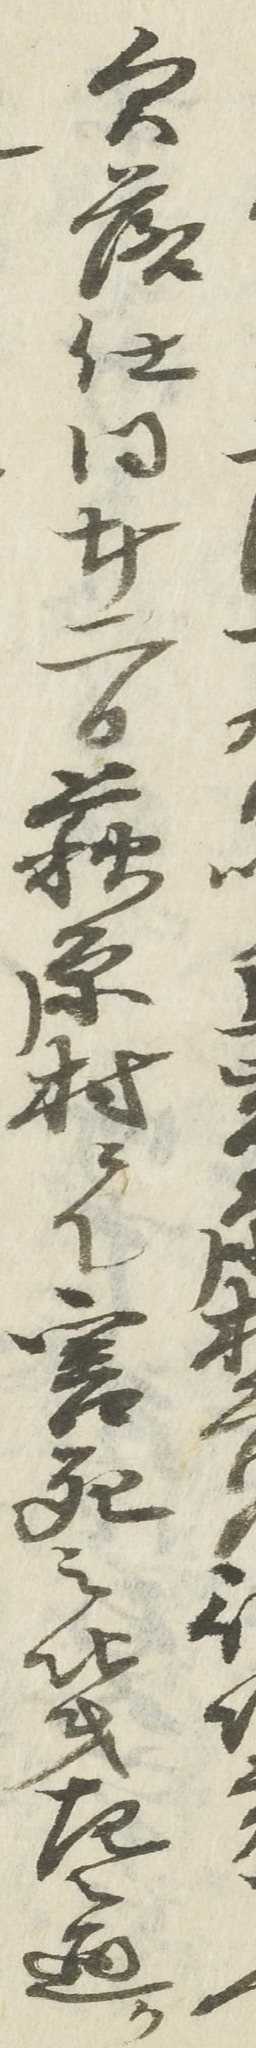欠落仕同廿二日萩原村ニて害死之次第左之通り
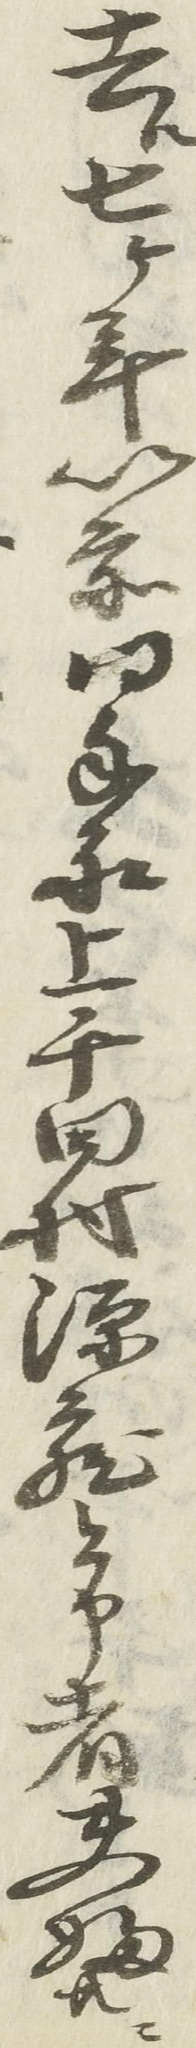去ル七ヶ年以前同手永上千田村源蔵と申者夫婦共ニ
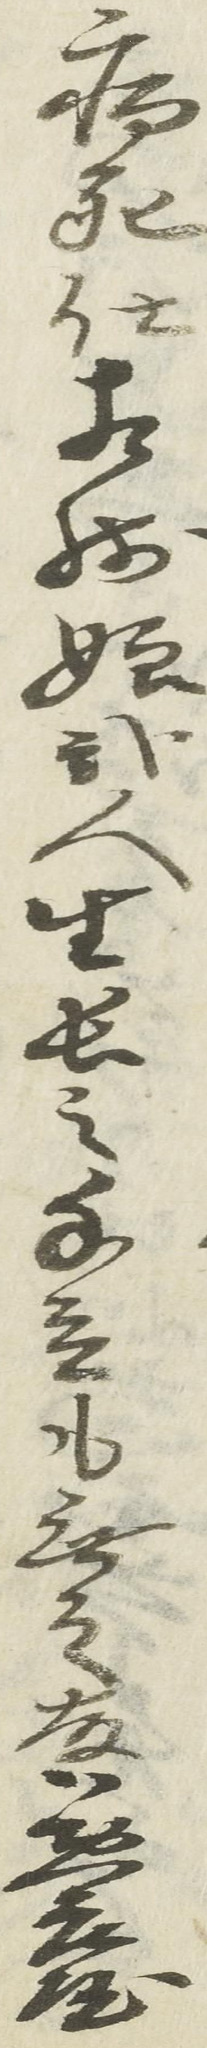病死仕相残娘弐人生長之手立も無之故御惣庄屋
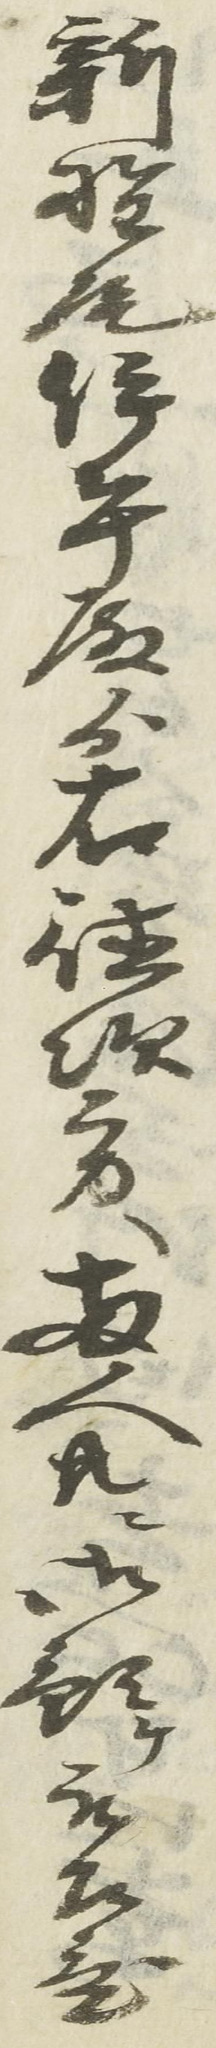新権尾伊平殿ゟ右徳次方ヘ両人共ニ御預ケ被召置
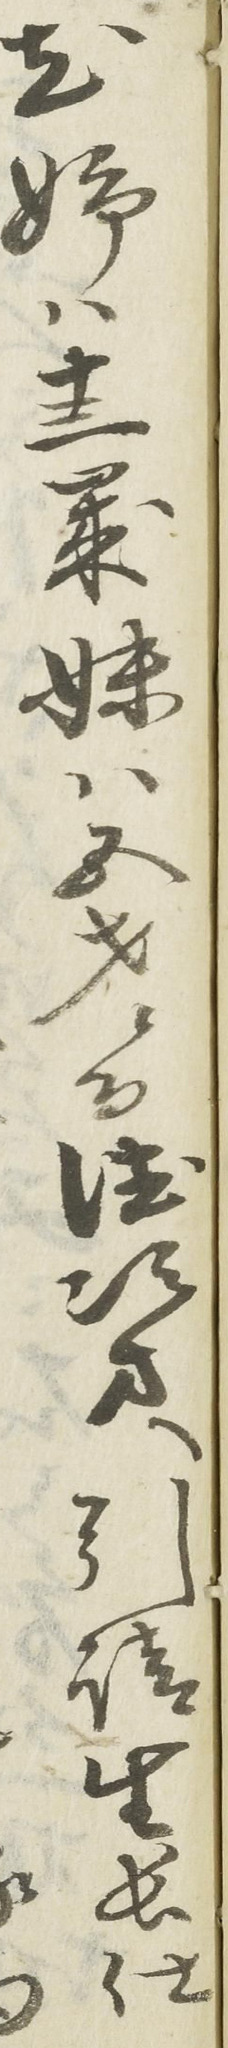尤姉は十三歳妹は五才ニ而徳次方ヘ引請生長仕
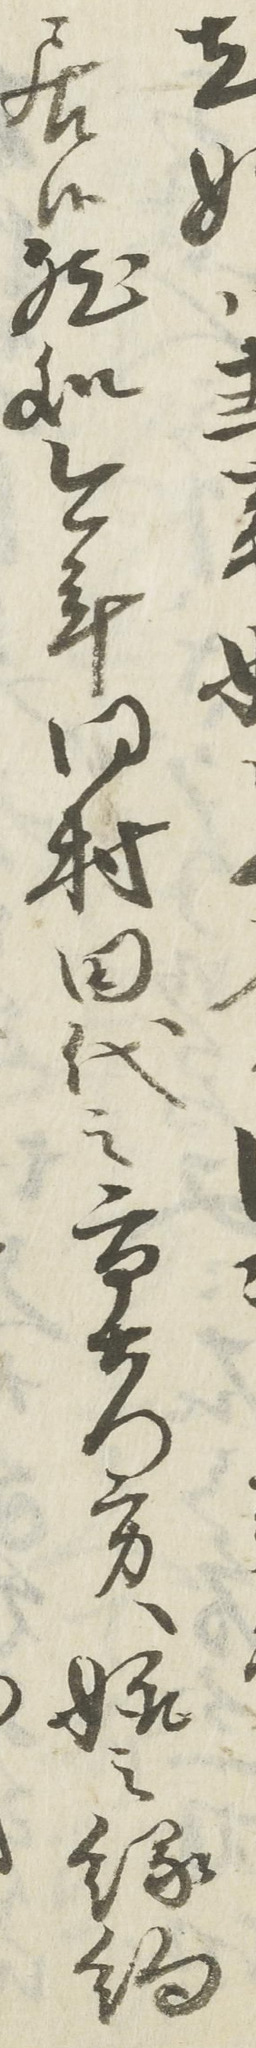居候然処今年同村田代之市右衛門方ヘ娵ノ縁約
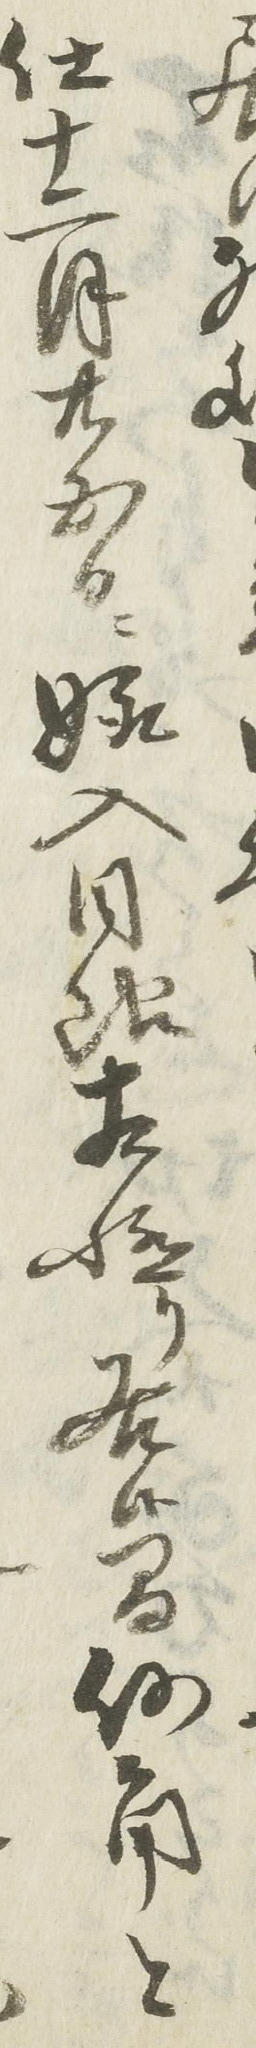仕十二月廿五日ニ娵入日限相極り居候間何角と
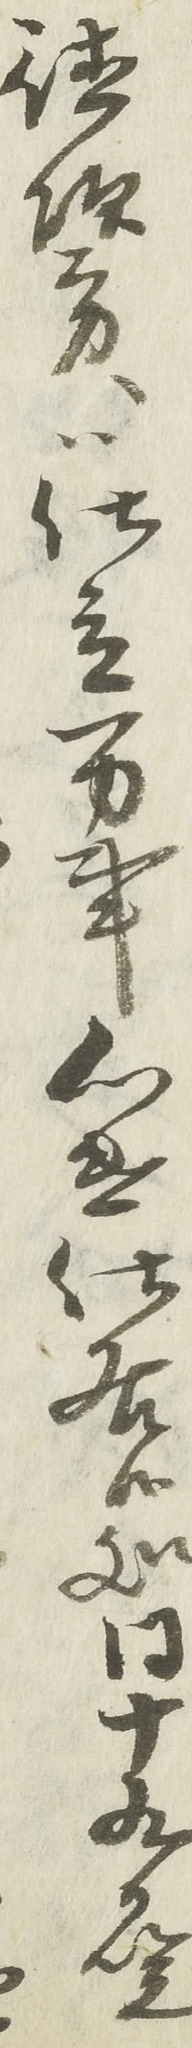徳次方ヘは仕立万事心遣仕居候処同十九日晩
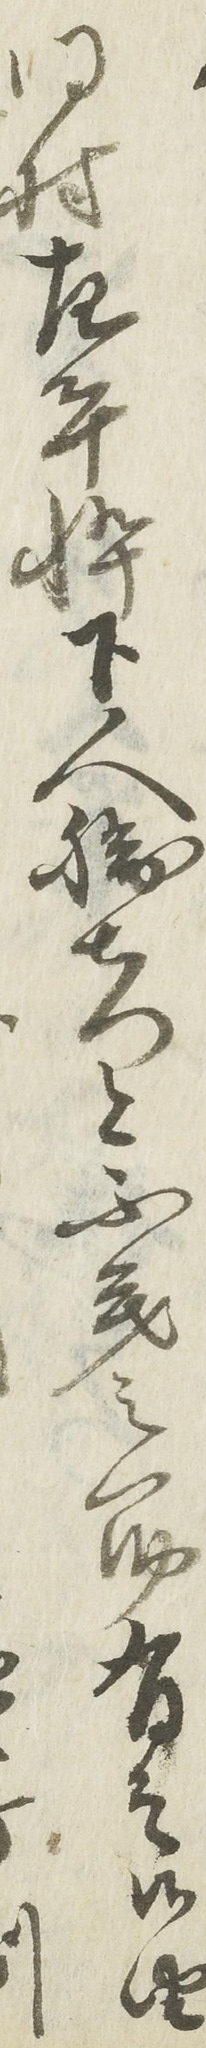同村左平忰下人勝右衛門と不義之筋有之候由
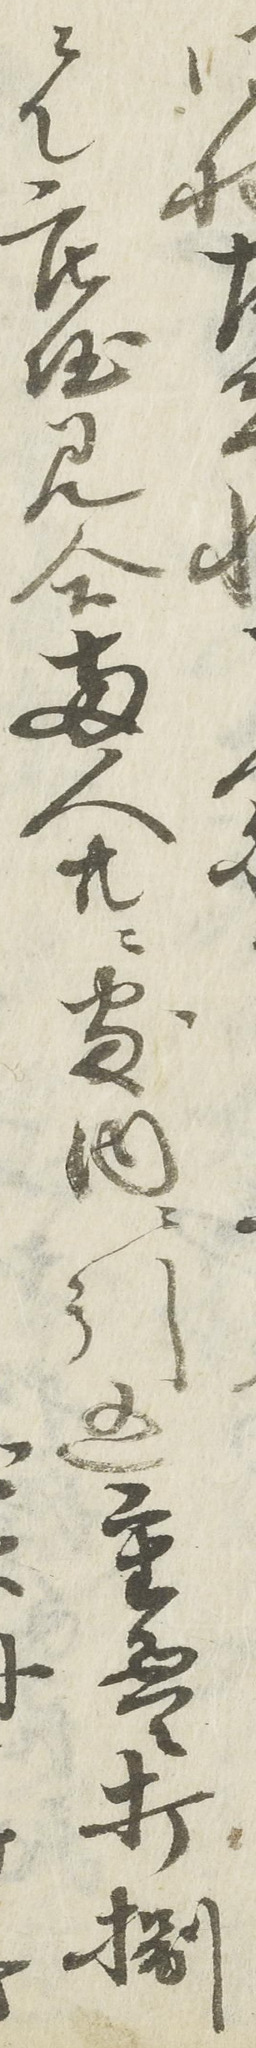ニて庄屋見合両人共ニ家内ニ引込重畳打捌
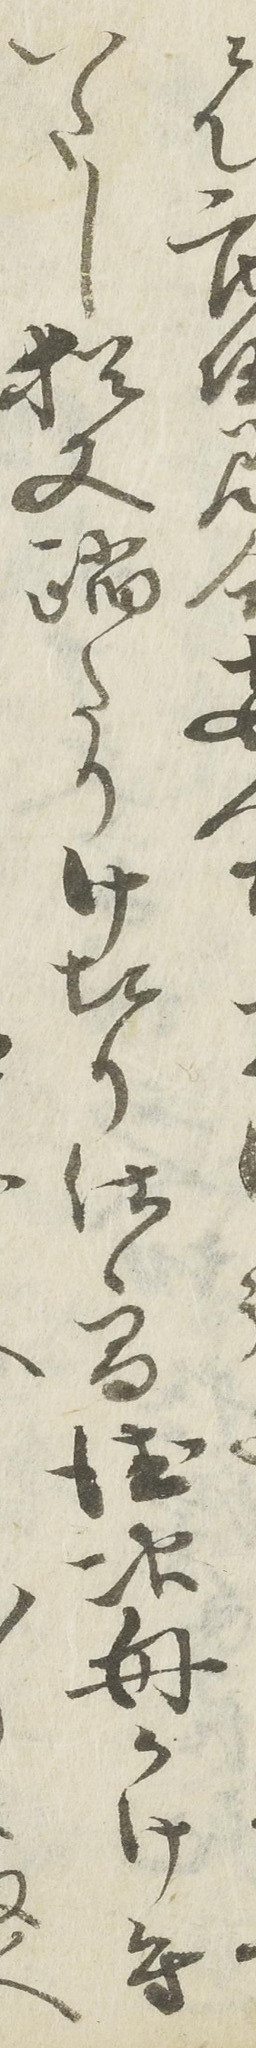いたし猶又踏たりけたり仕候間徳次母かけ付
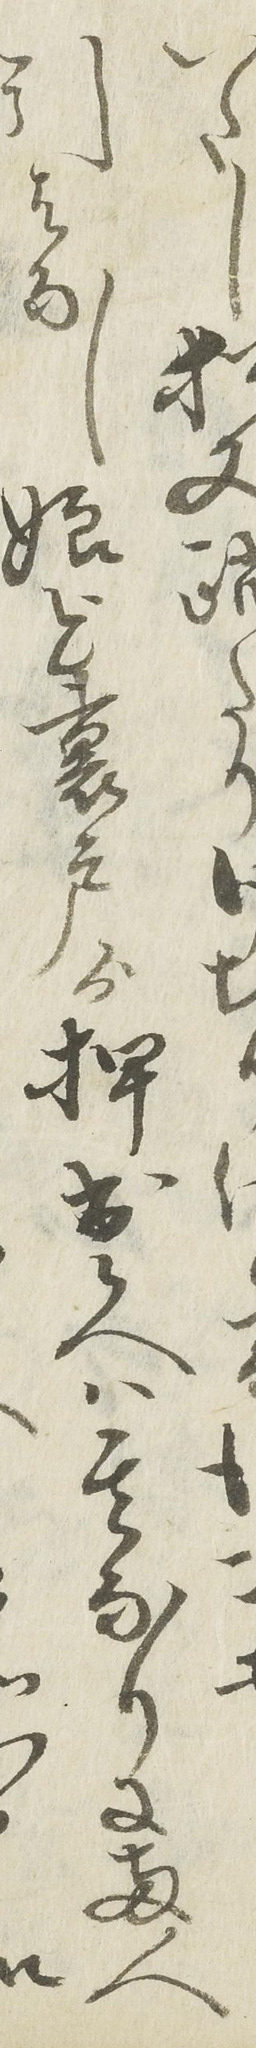引はなし娘を裏戸ゟ押出候へは其なりに両人
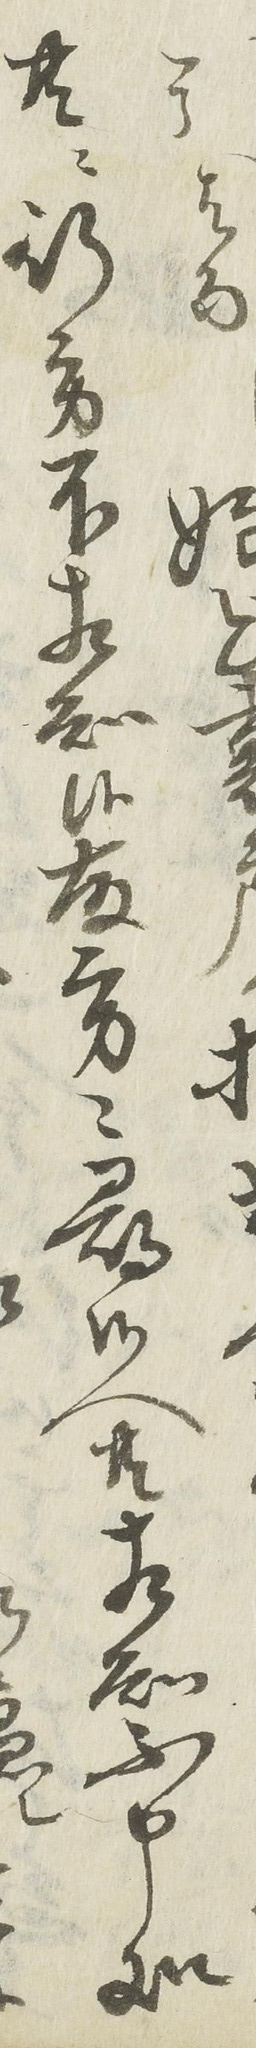共ニ行方不相知候故方〻尋候へ共相知不申処
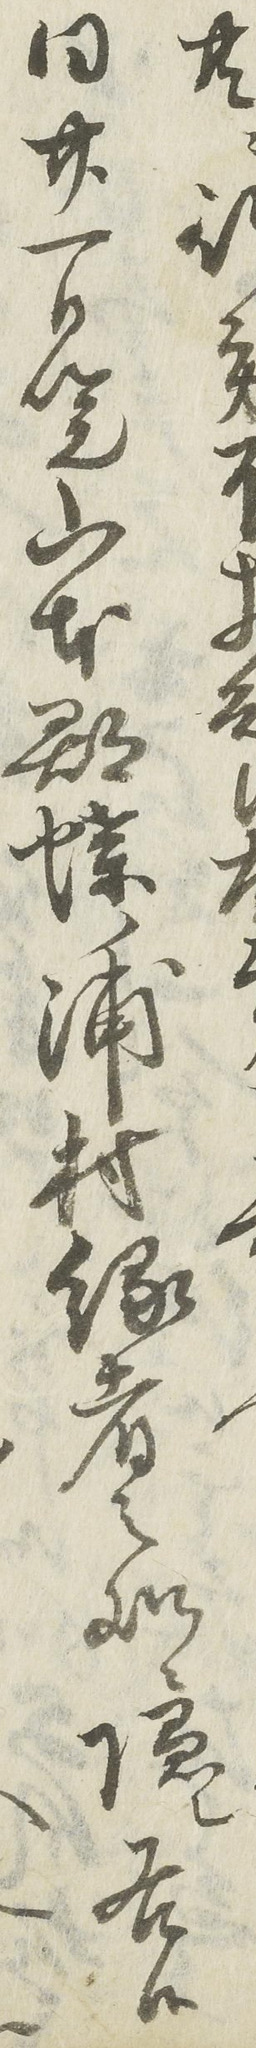同廿一日晩山本郡蝶ノ浦村縁者之処二隠レ居候
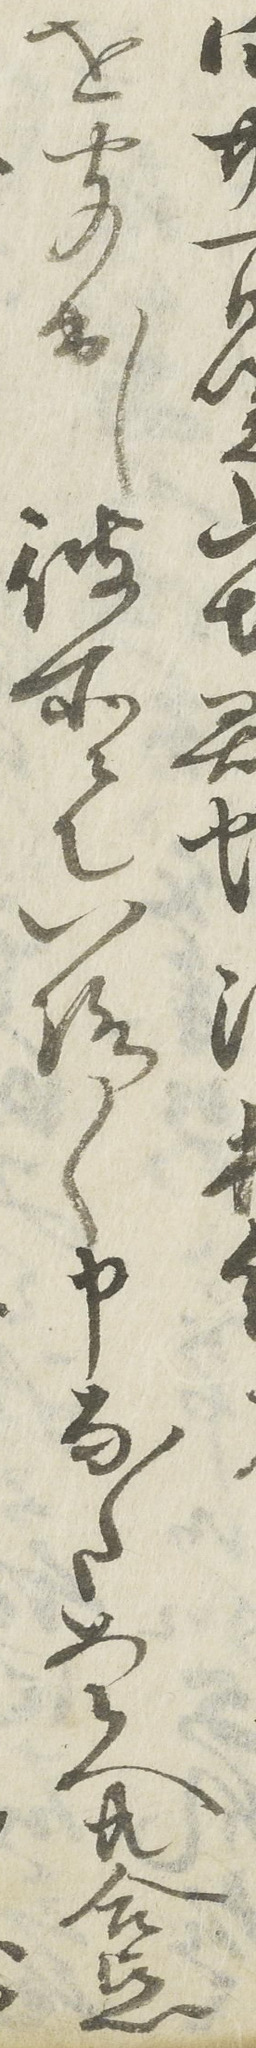を聞出し彼所にていろ〳〵申なため候へ共合点
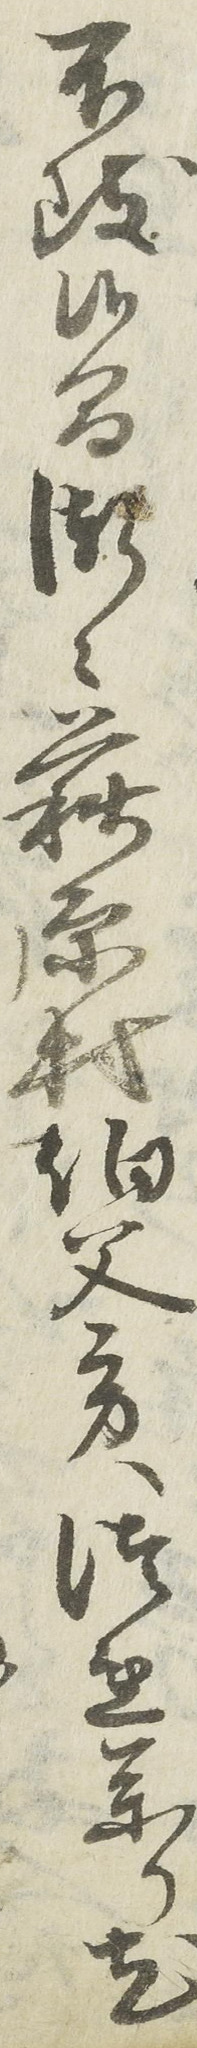不致候間漸〻萩原村伯父方ヘつれ参り尤
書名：後見笑
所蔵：東京大学地震研究所図書室 Earthquake Research Institute Library, The University of Tokyo, JAPAN
